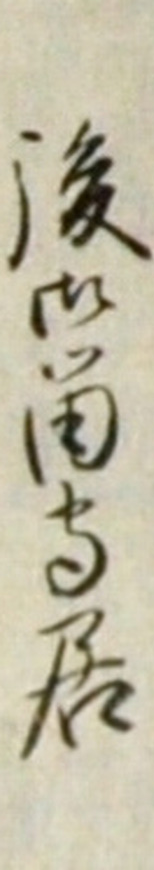後御留守居
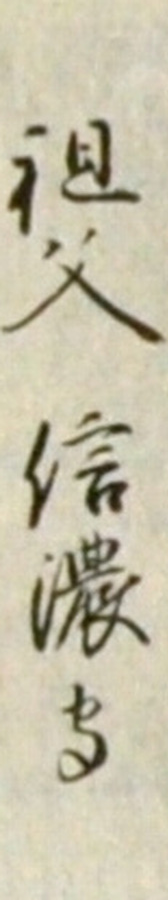祖父信濃守
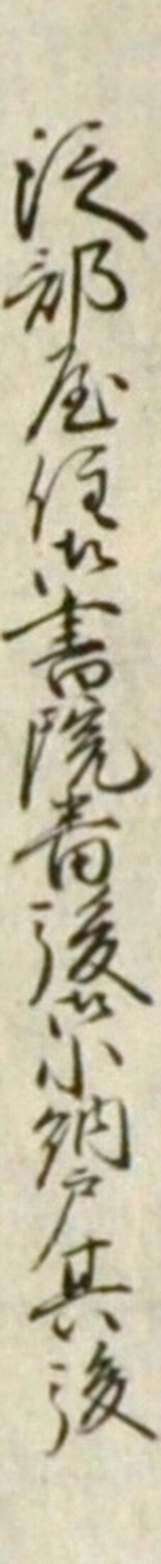従部屋住御書院番後御小納戸其後
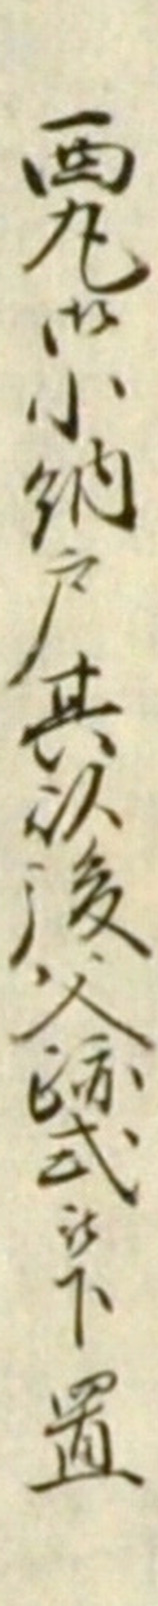西丸御小納戸其以後父跡式被下置
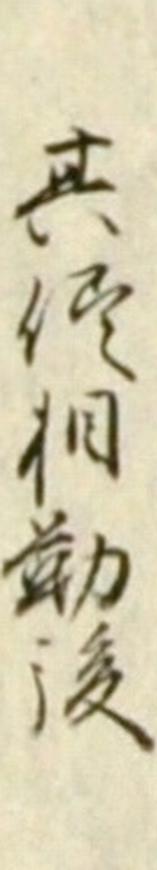其侭相勤候
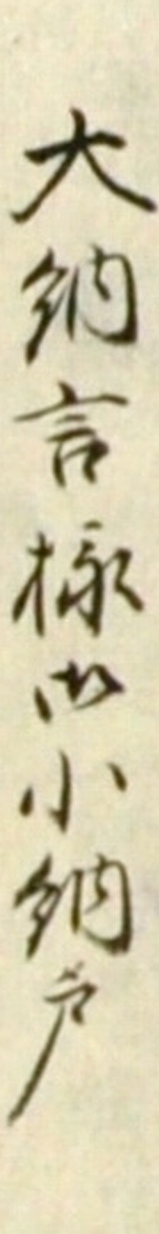大納言様御小納戸
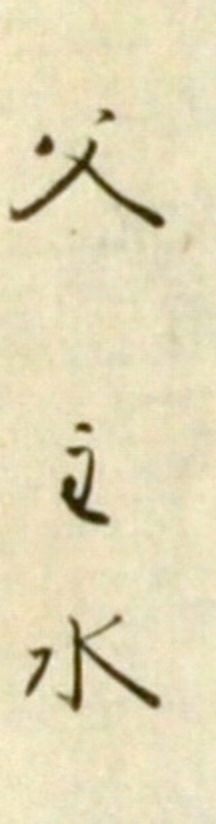父主水
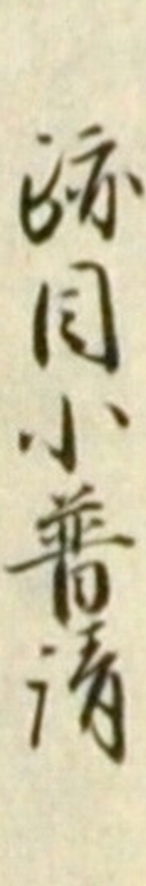跡目小普請
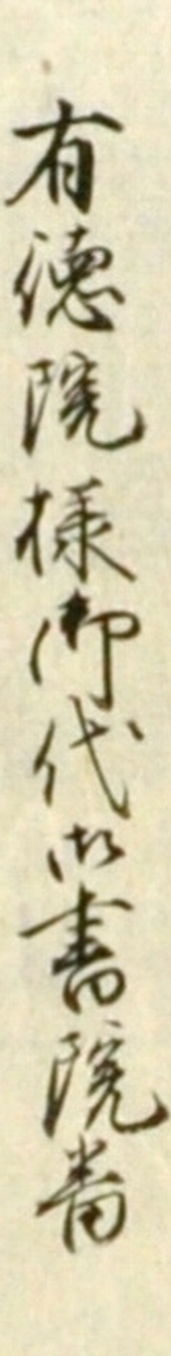有徳院様御代御書院番
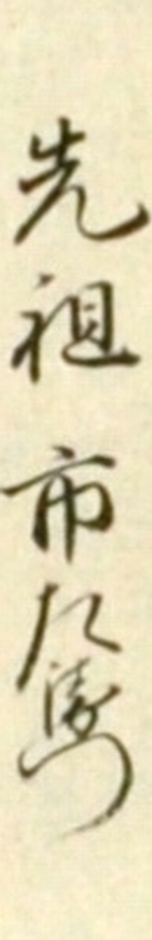先祖市左衛門
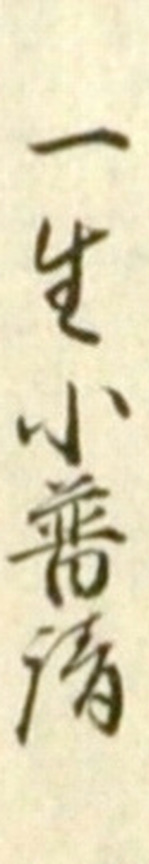一生小普請
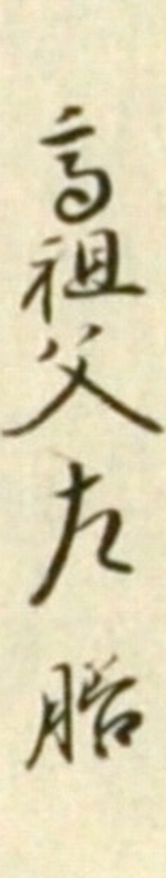高祖父左膳
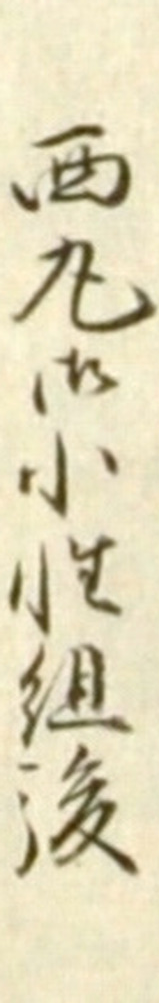西丸御小姓組後
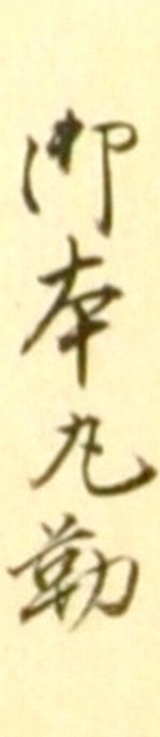御本丸勤
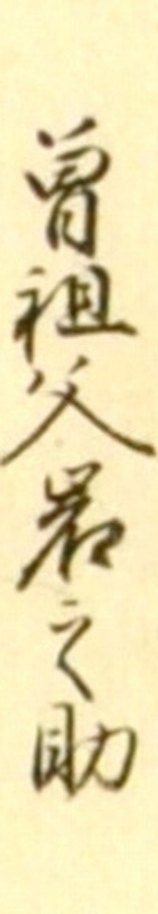曽祖父岩之助
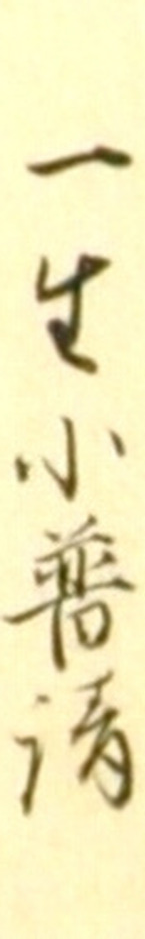一生小普請
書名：若年寄御役中御調書付
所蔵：伊那市立高遠町図書館・合同会社AMANE
